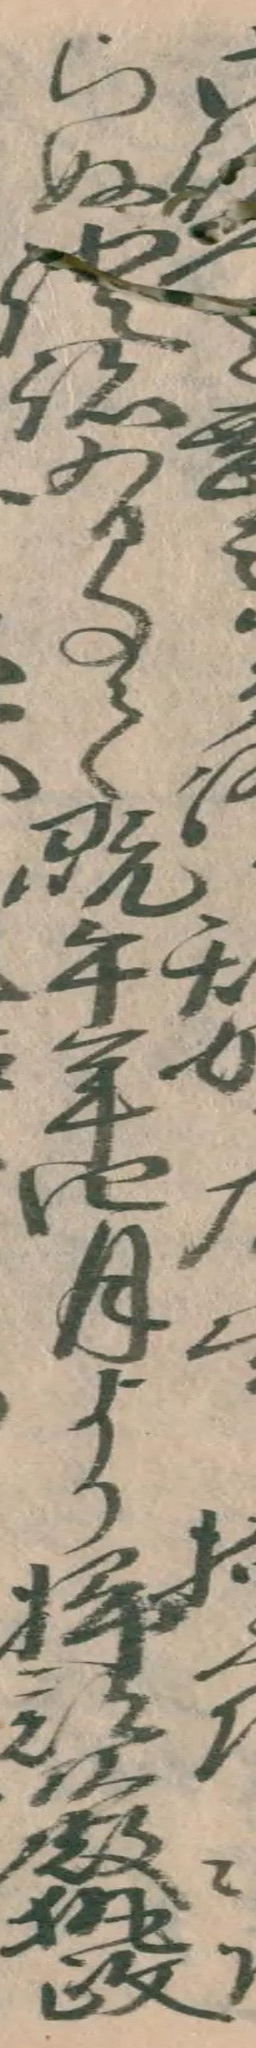らぬ證跡有事ニ候既午年四月より掃部頭殿執政
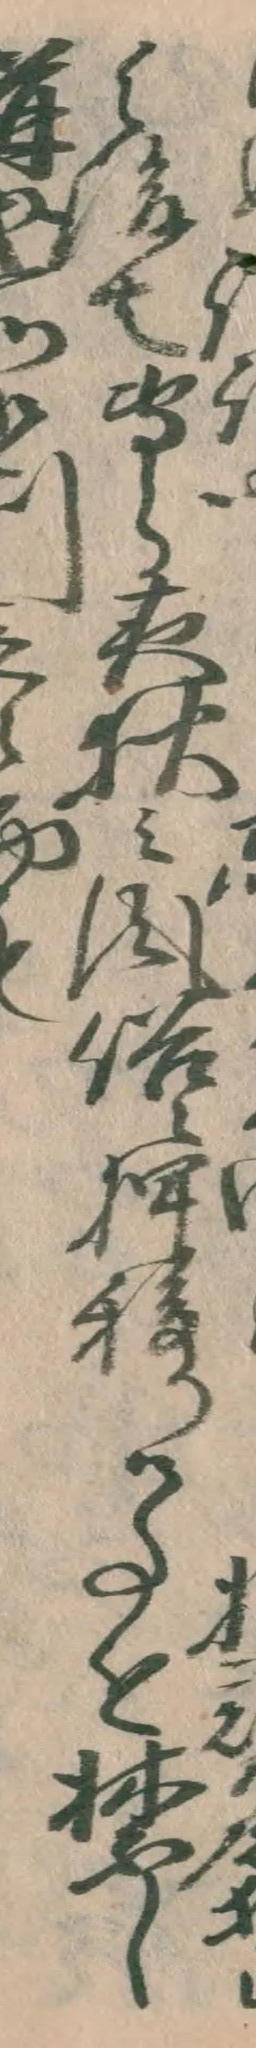之後者専ら夷狄之風俗ニ押移り候事を禁し
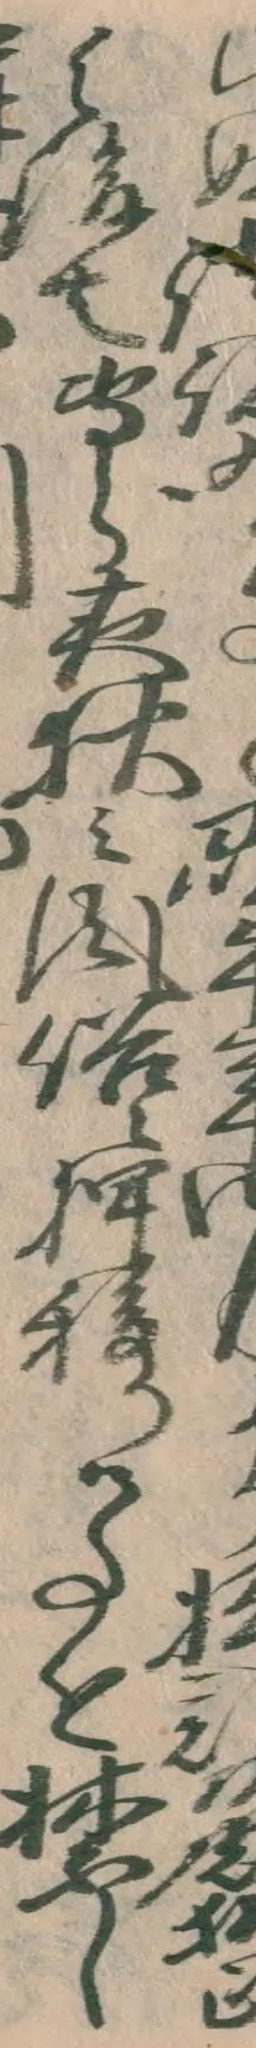之後者専ら夷狄之風俗ニ押移り候事を禁し
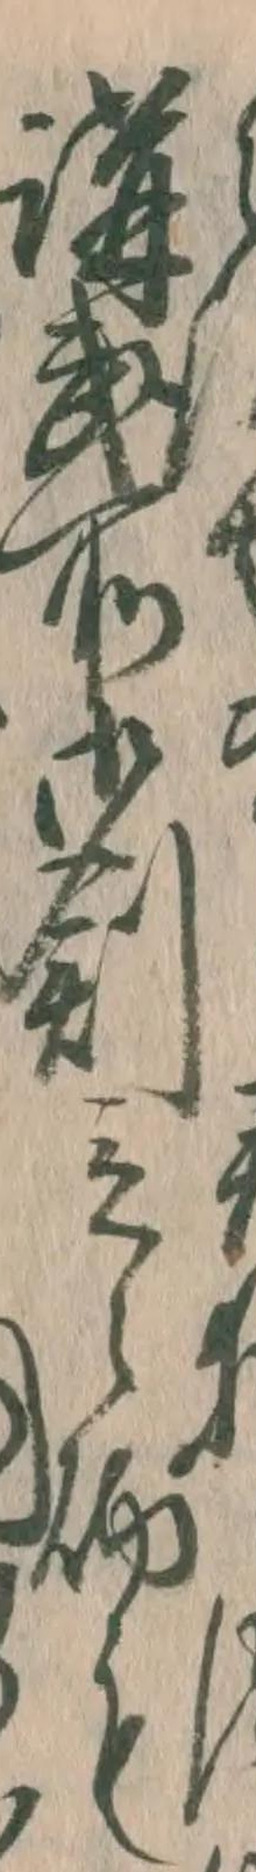講武所御創立之砌も
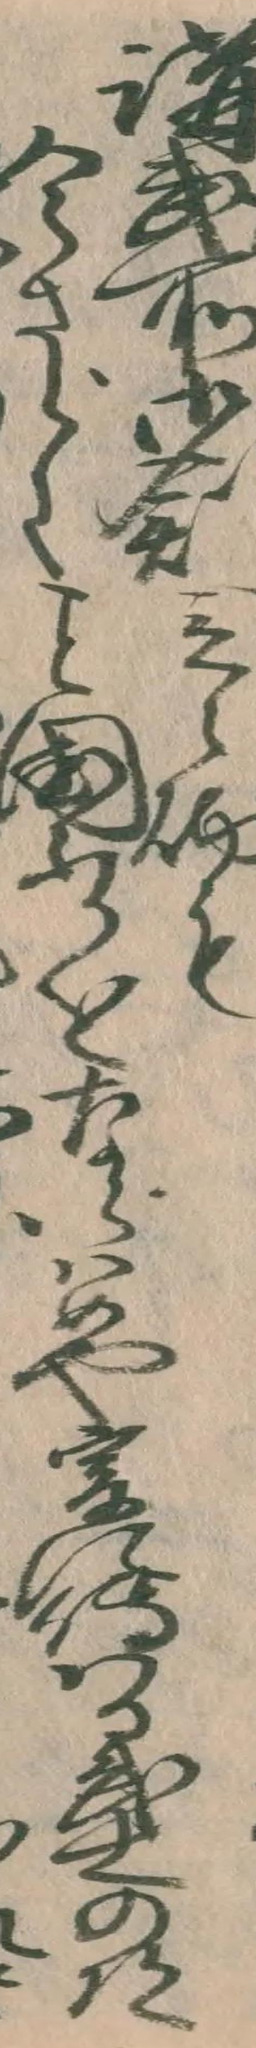今さらにこと国ふりをならハめや爰に傳ハる武士の道
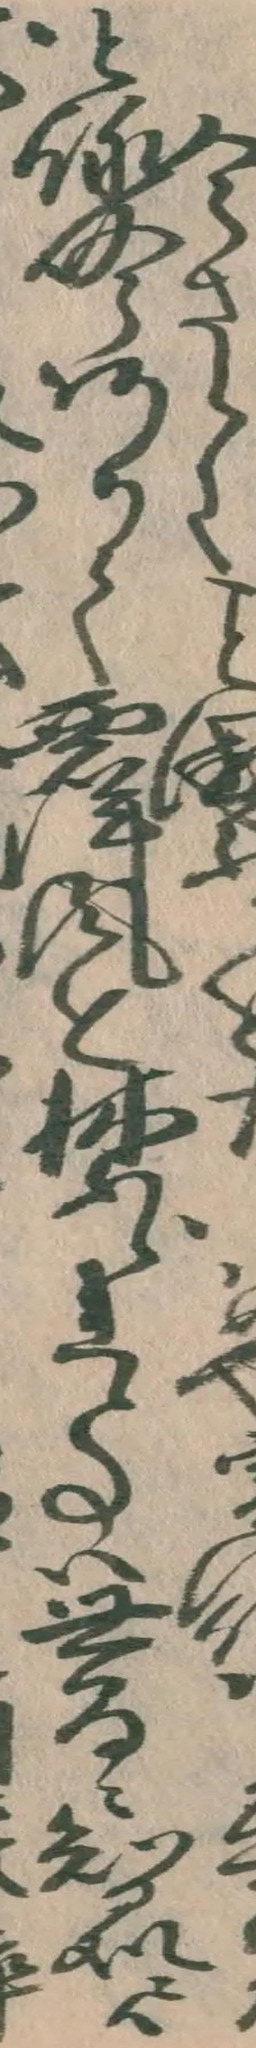と詠哥ありて西洋風を禁られ候事ハ世間ニ知る処ニ候
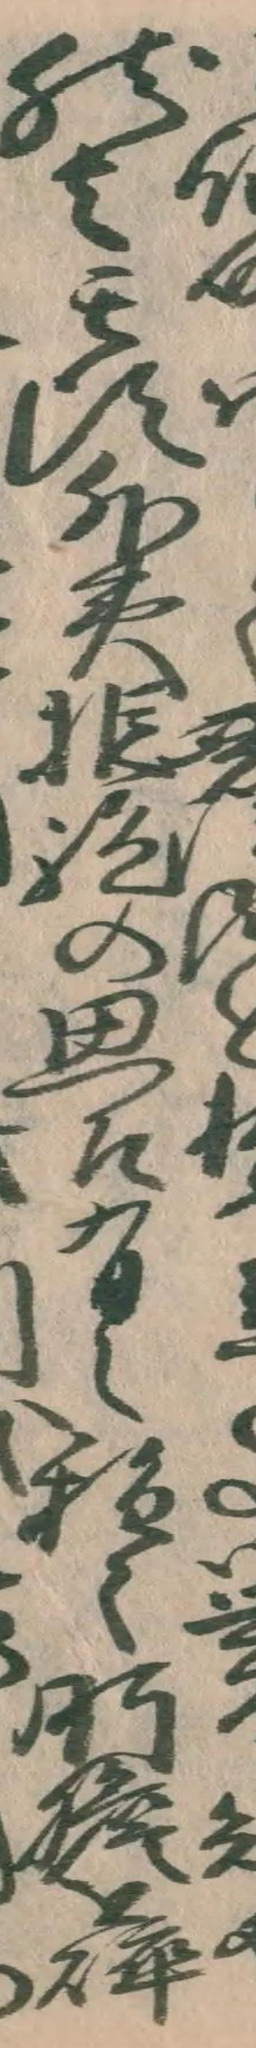然者其頃外夷拒絶の思召有之種々肝膽を碎
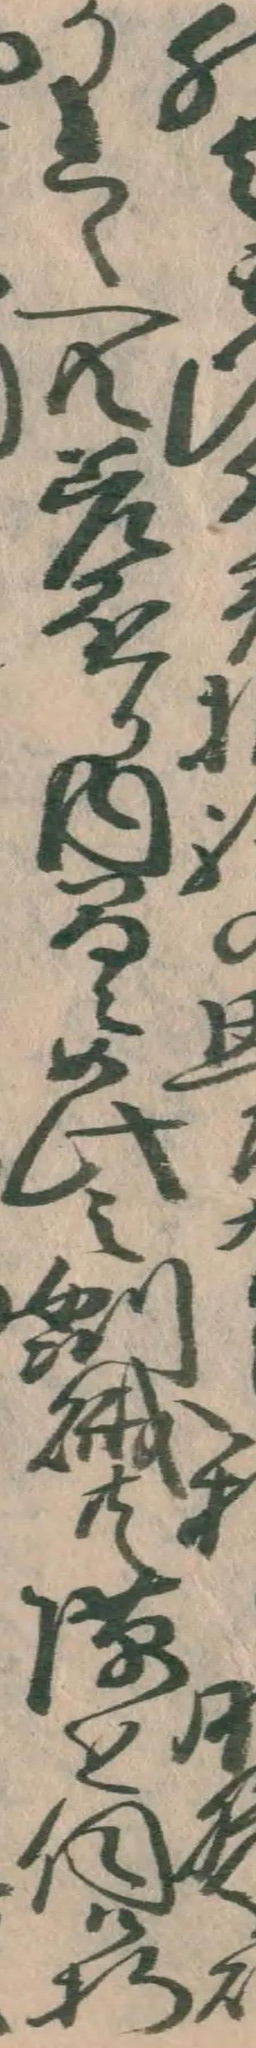かれ候へ共差懸り内間ニ如此之姧賊共隙を伺候折
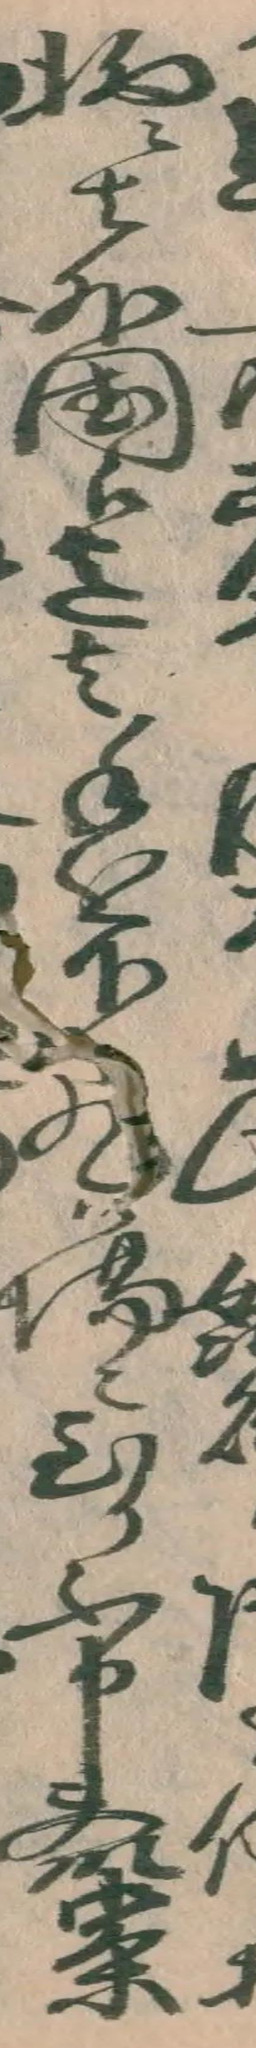柄ニは外国江迄者手を下され候場ニ至り不申夫故御条
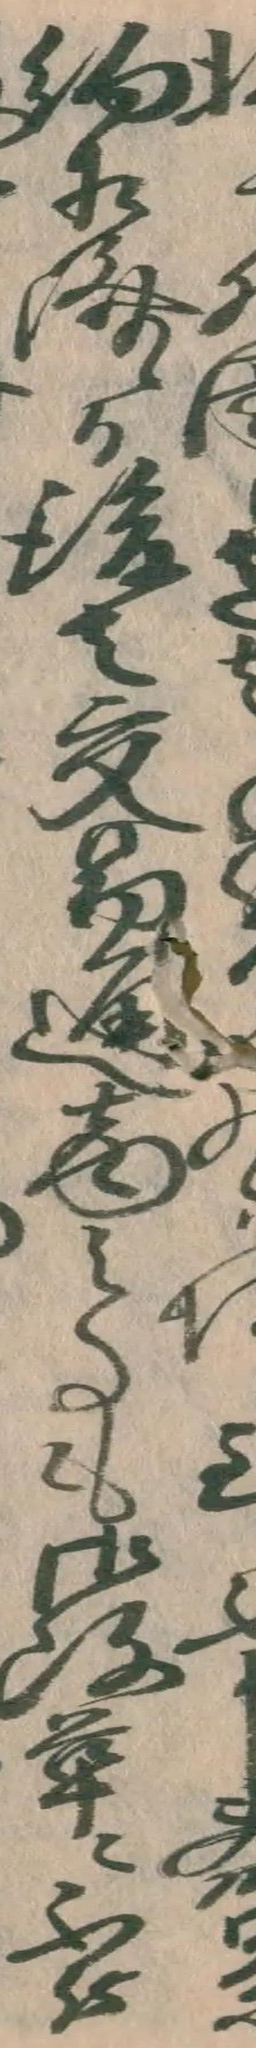約相濟候而後者交易通商之事も御改革ニ不被
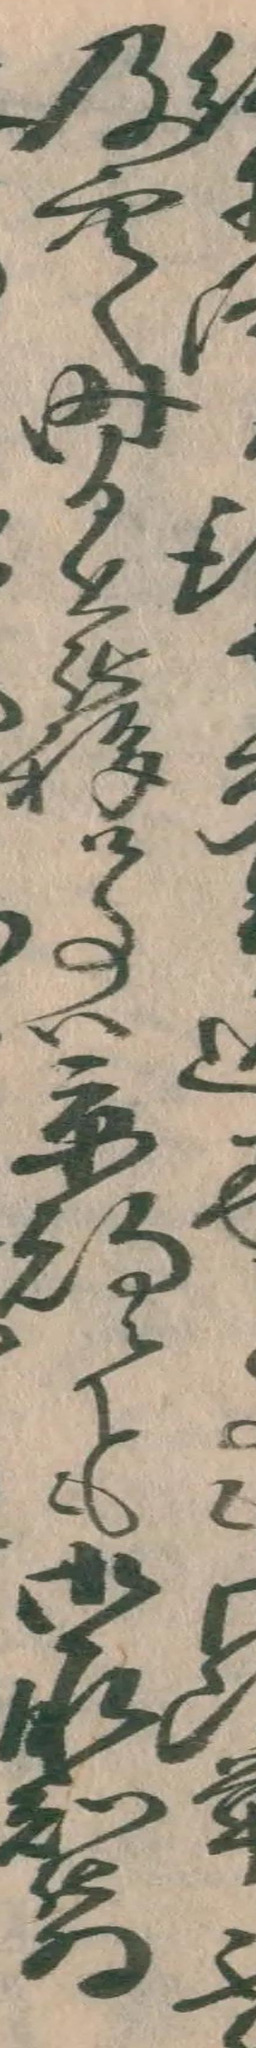及空く時日を被移候事ハ京都ニても御承知被為
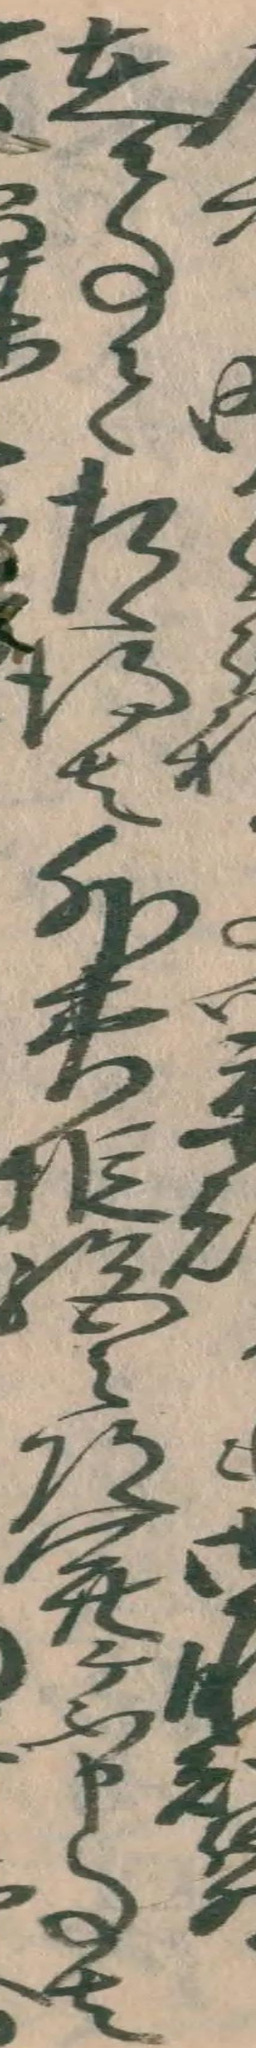在候事ニ候左候得者外夷拒絶之道開ケ不申事者
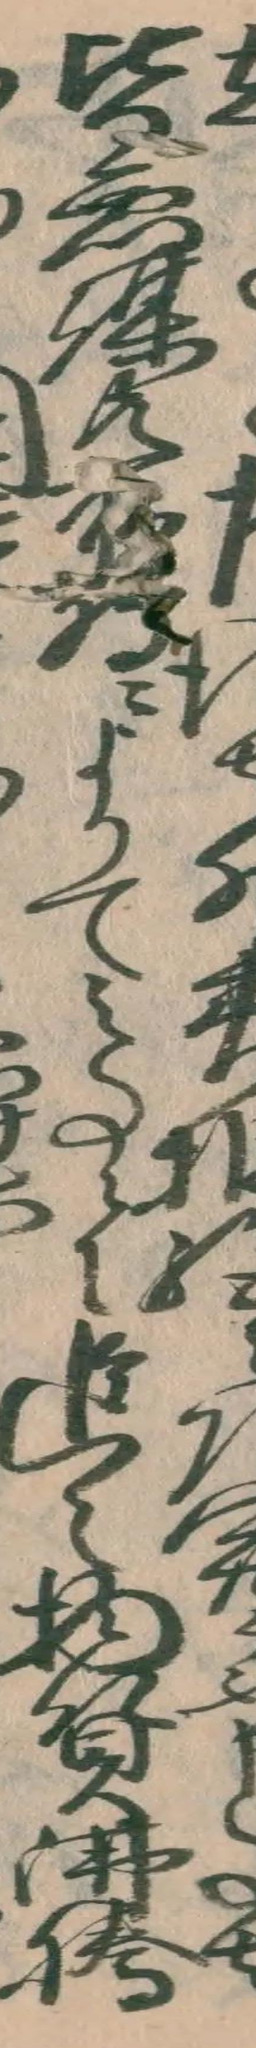皆悪謀共所持ニよりて之事ニて追々物資沸騰
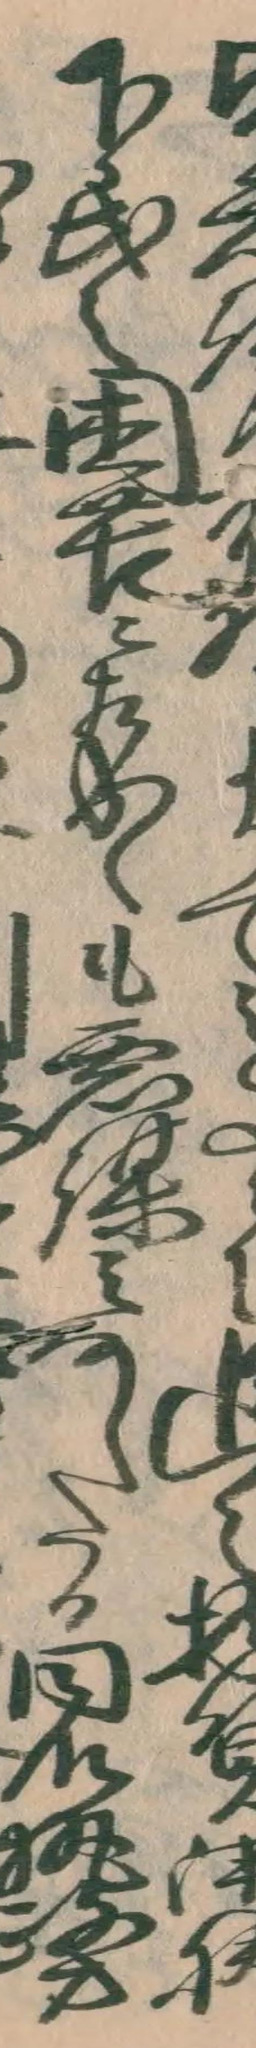下民之困苦ニ相成候も悪謀之なしたる同様執政方
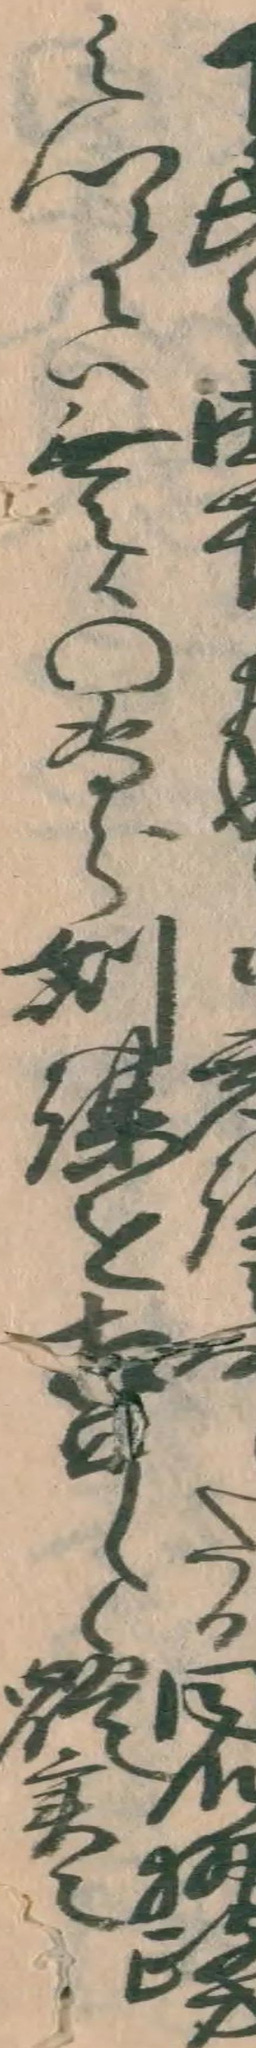之心ニてハ無之候〇専ら姧謀を相廻し候體実ニ
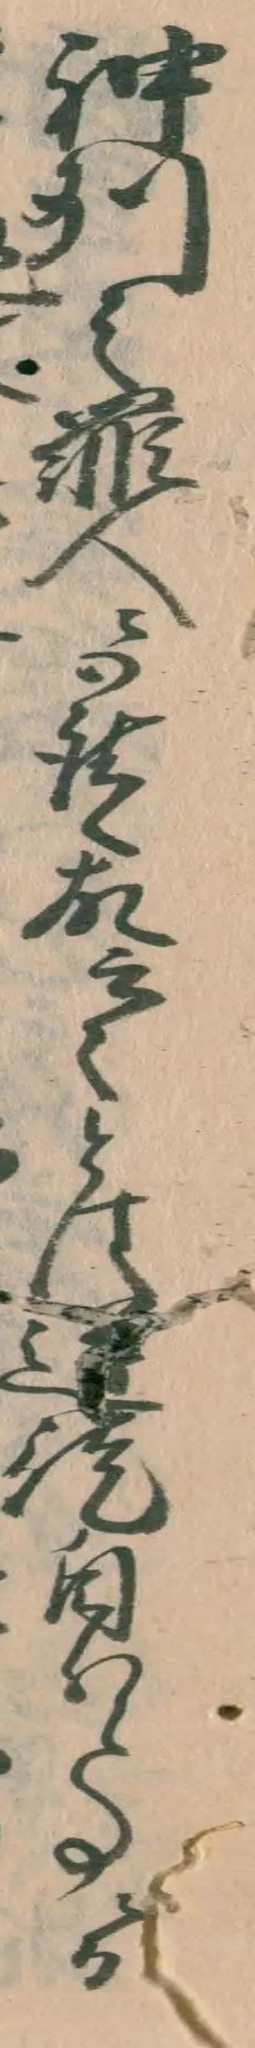神州之罪人ニ御座候故云々とは逆徒自分之事ニ而
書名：麗斎叢書. 20
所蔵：国立国会図書館 National Diet Library, JAPAN
